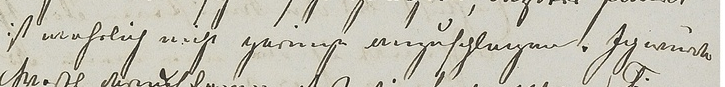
ist wahrlich nicht gering anzuschlagen. Ich würde
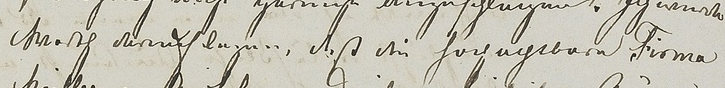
Werth darauf legen, daß die hochachtbare Firma
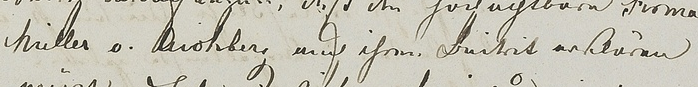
Miller v. Aichberg auch ihren Beitrit erklären
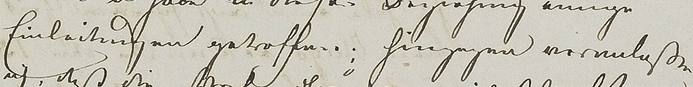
Einleitungen getroffen; hingegen veranlaßte
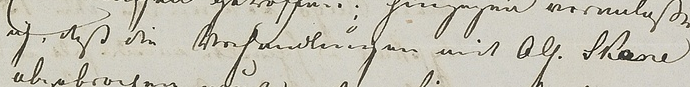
ich, daß die Verhandlungen mit Alf. Skane
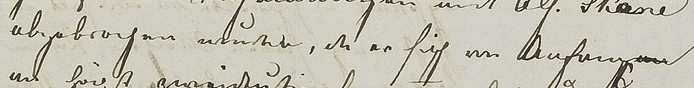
abgebrochen wurden, da er sich von Anfang an
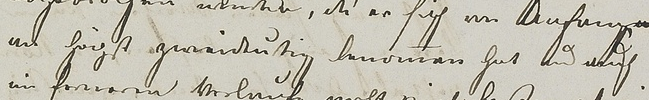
an höchst zweideutig benommen hat und auch
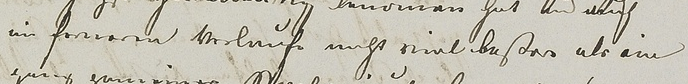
im ferneren Verlaufe nicht viel beßer als ein
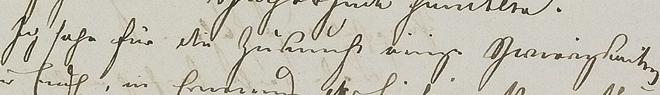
Ich sehe für die Zukunft einige Schwierigkeiten
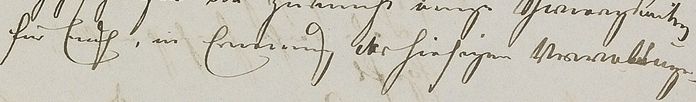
für Euch, in Ernennung des hiesigen Verwaltungs-
